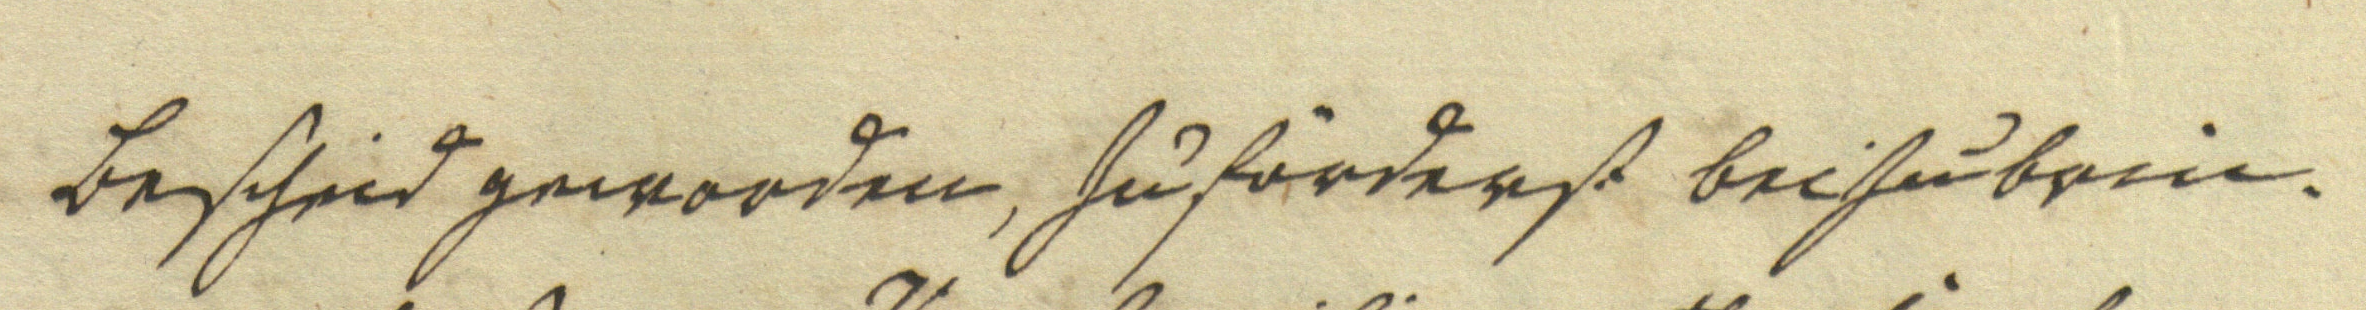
Bescheid geworden, zuförderst beizubrin¬
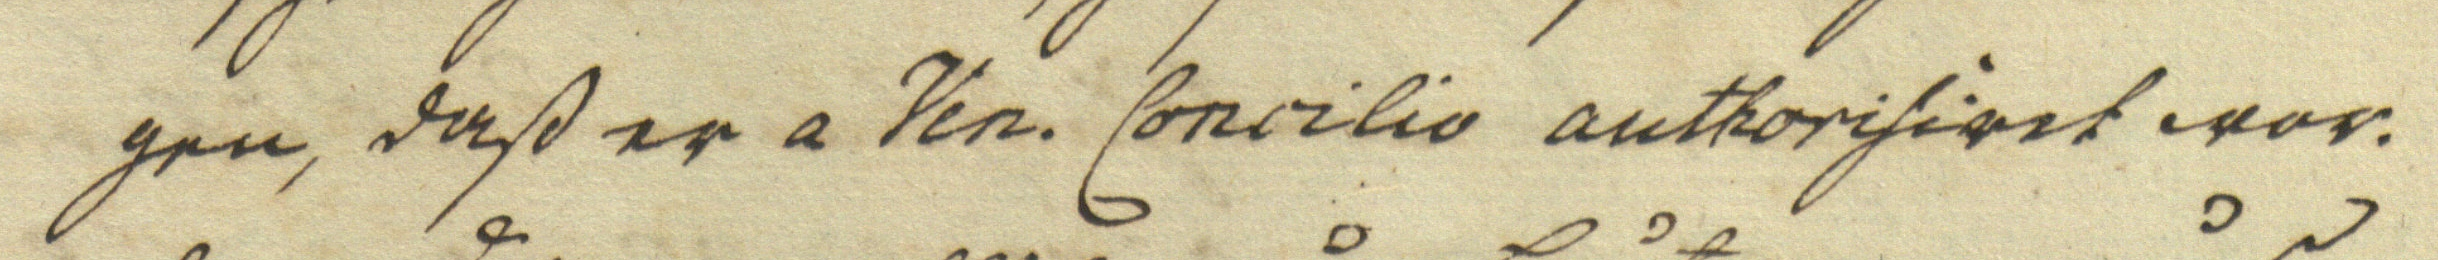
gen, daß er a Ven. Concilio authorisiret wor¬
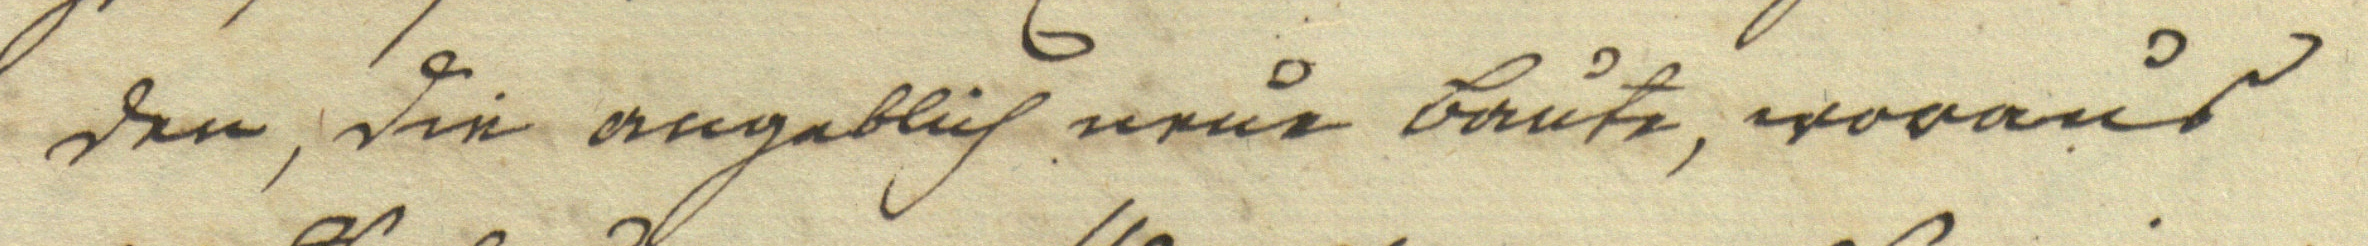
den, die angeblich neue Baute, woraus
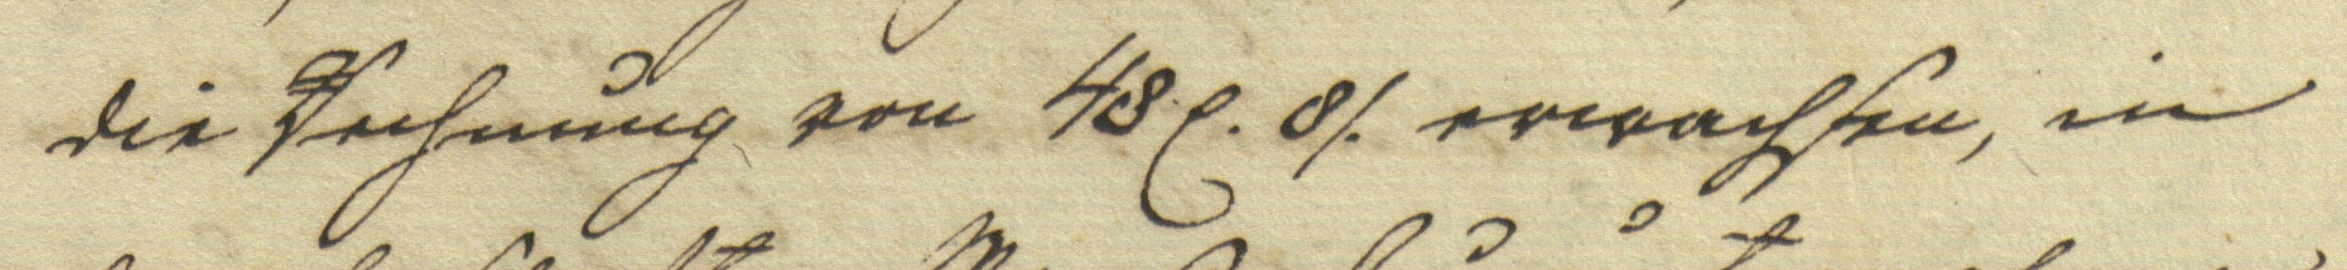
die Rechnung von 48 l. 8 s. erwachsen, in
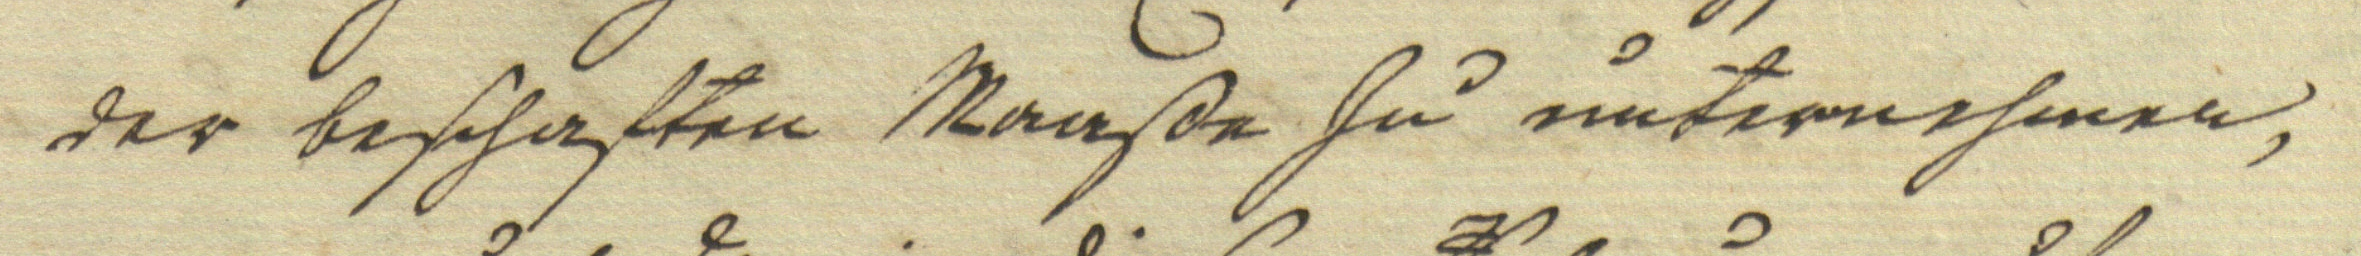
der beschaften Maaße zu unternehmen,
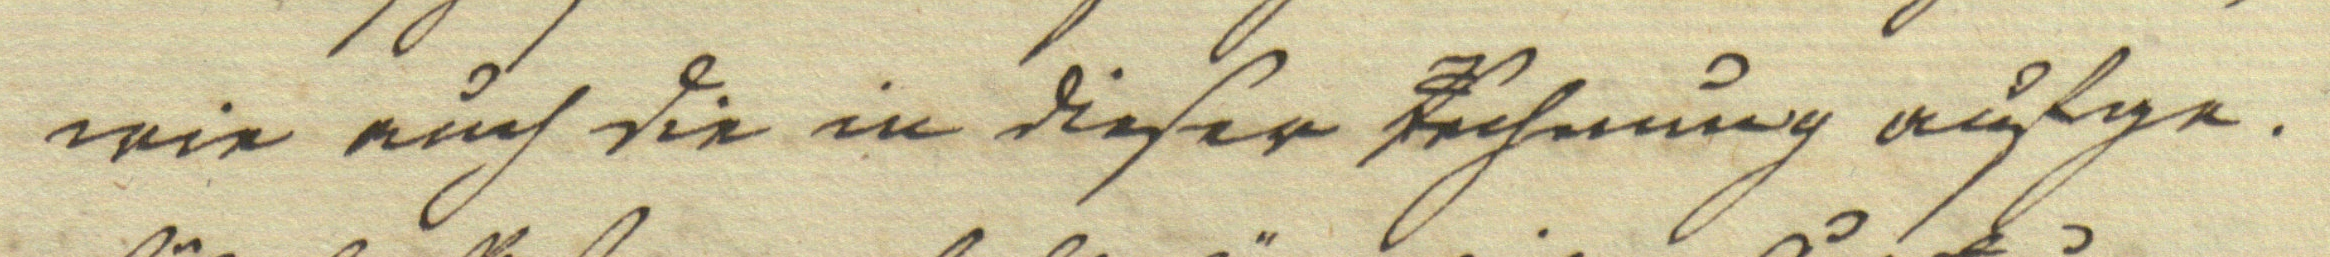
wie auch die in dieser Rechnung aufge¬
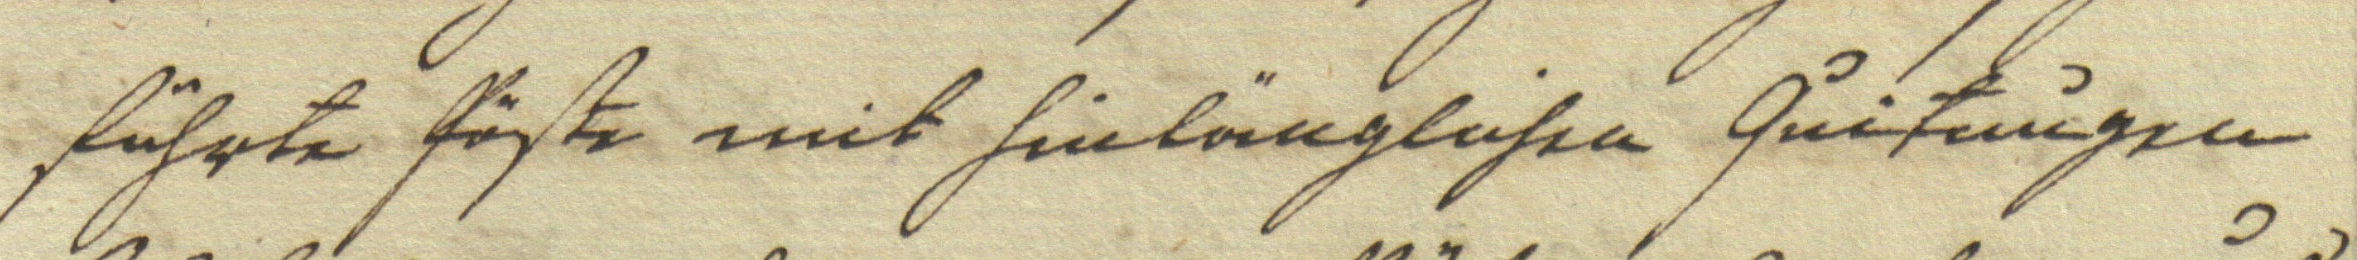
führte Pöste mit hinlänglichen Quitungen
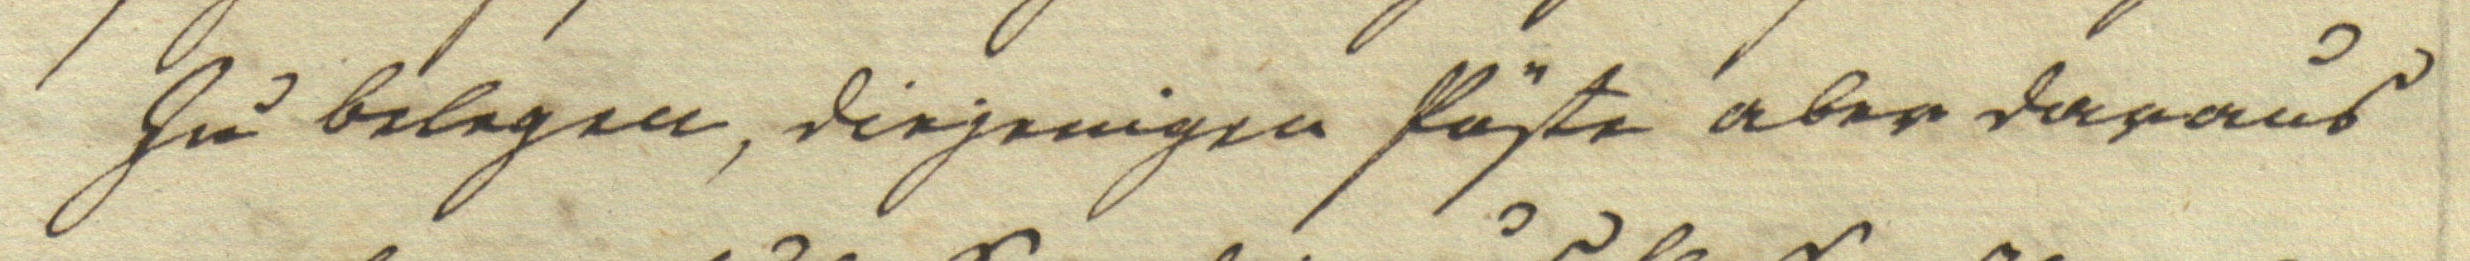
zu belegen, diejenigen Pöste aber daraus
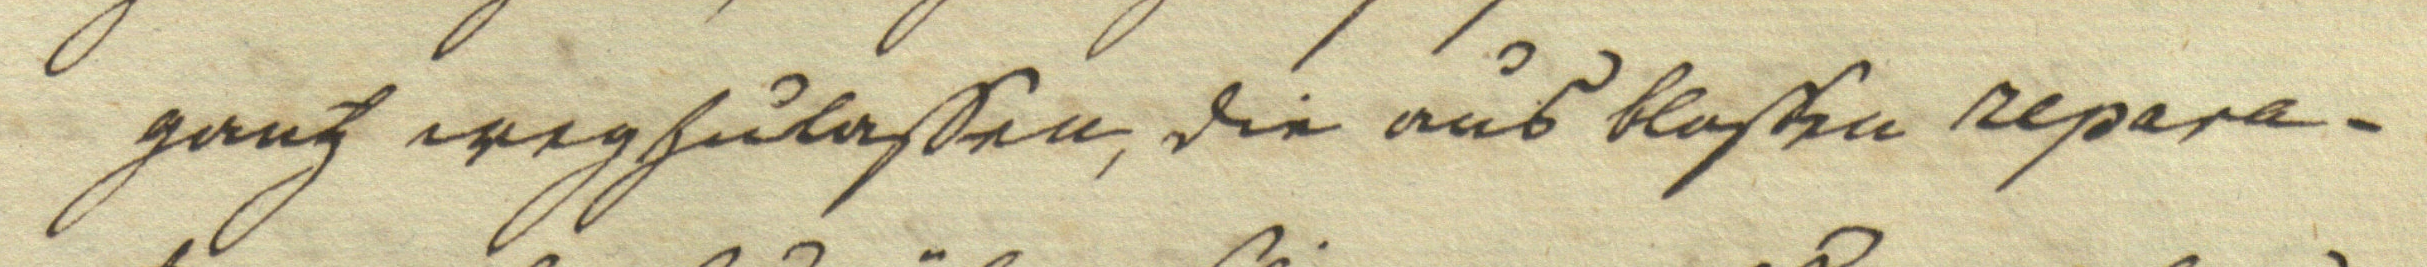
gantz wegzulassen, die aus blossen repara-
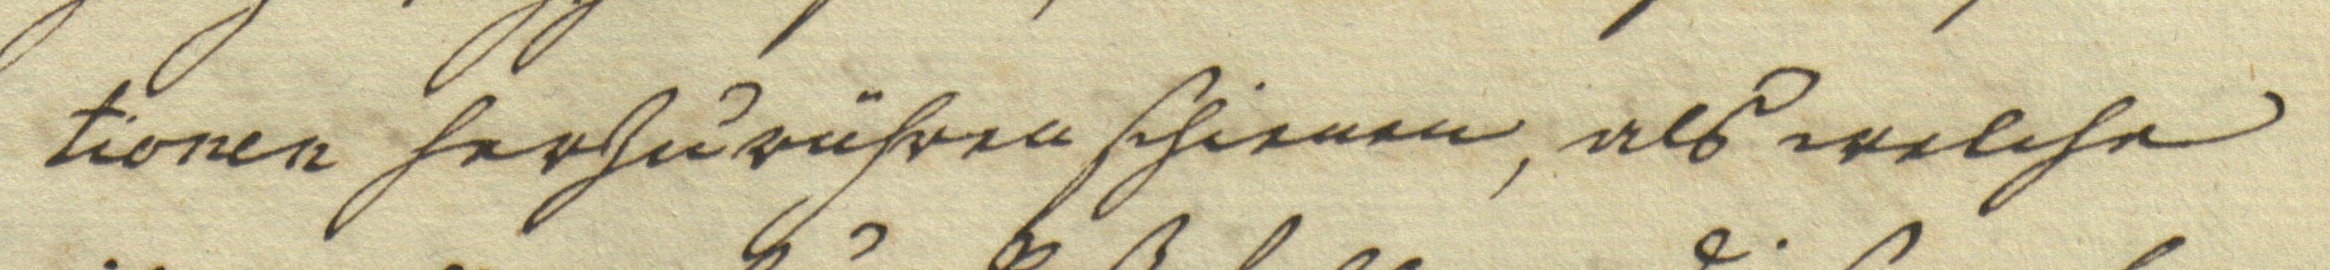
tionen herzurühren schienen, als welche
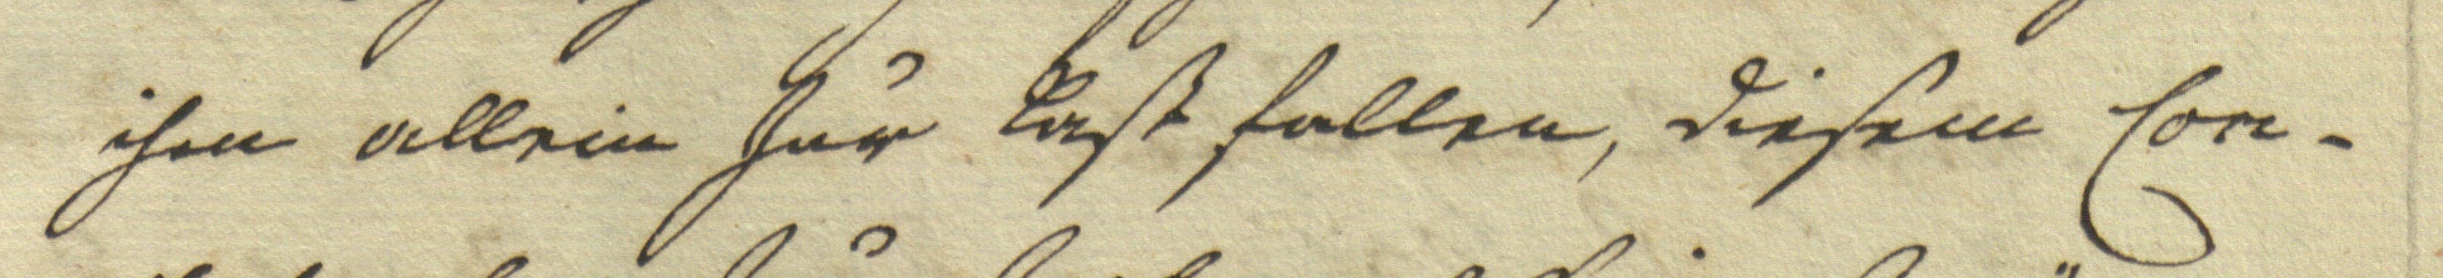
ihm allein zur Last fallen, diesem Con¬
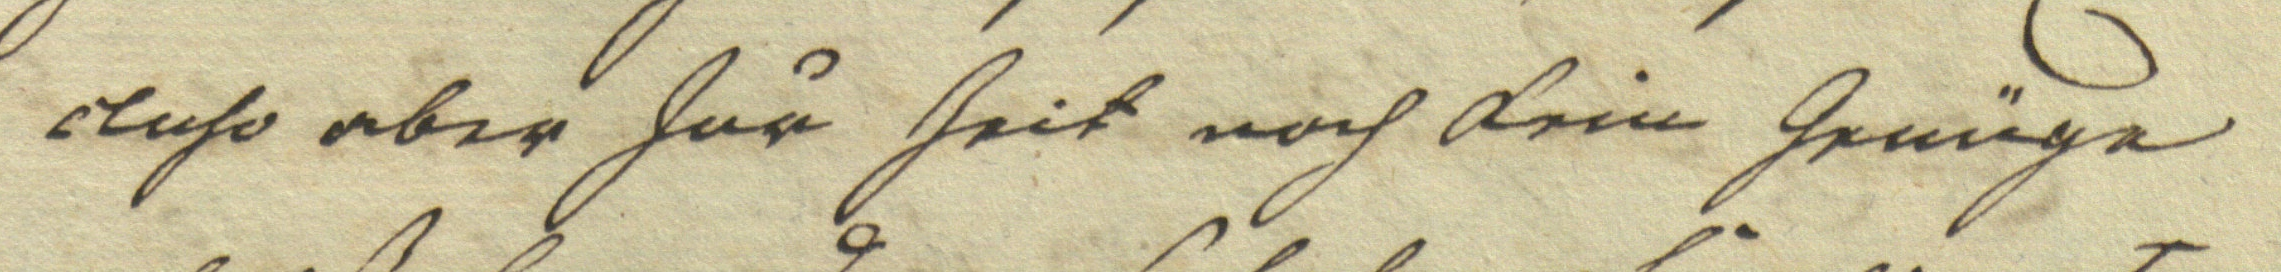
cluso aber zur Zeit noch kein Genüge
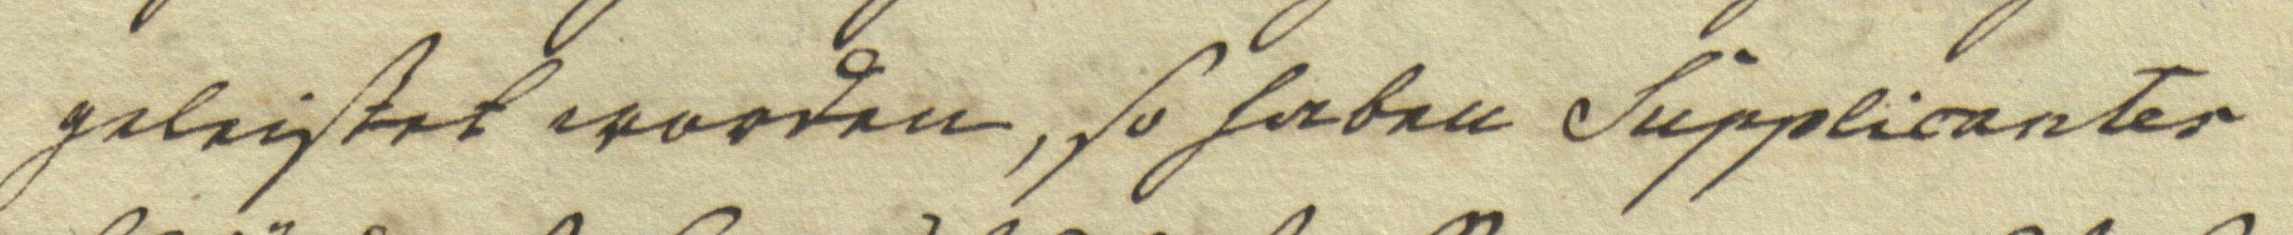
geleistet worden, so haben Supplicantes
